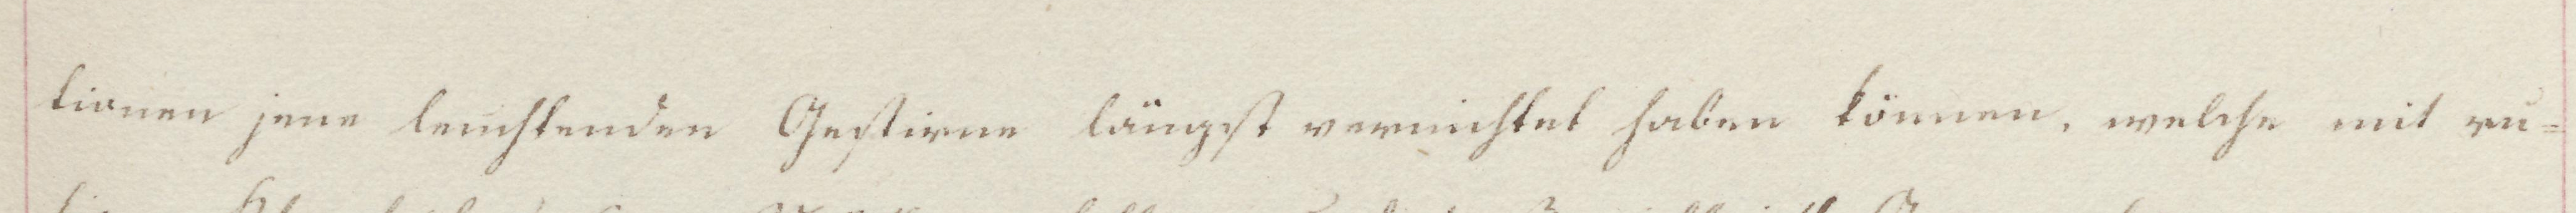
tionen jene leuchtenden Gestirne längst vernichtet haben können, welche mit ru-
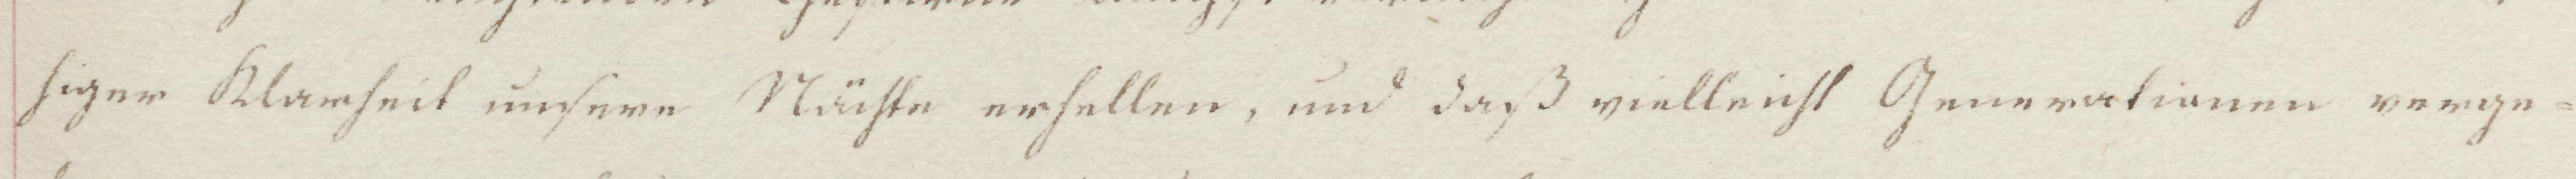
higer Klarheit unsere Nächte erhellen, und daß vielleicht Generationen verge-
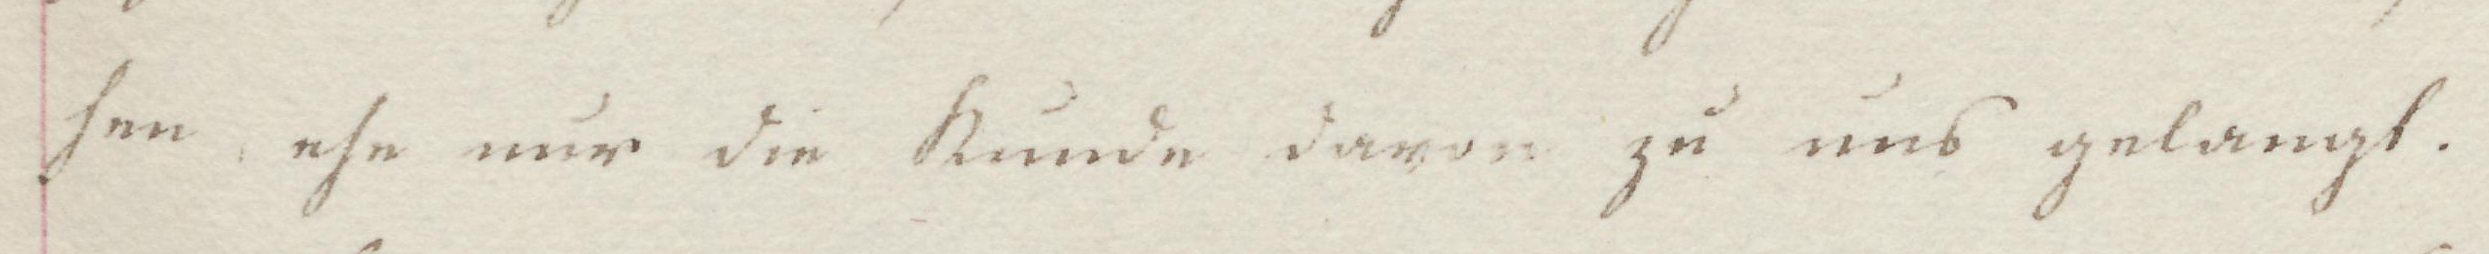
hen, ehe nur die Kunde davon zu uns gelangt.
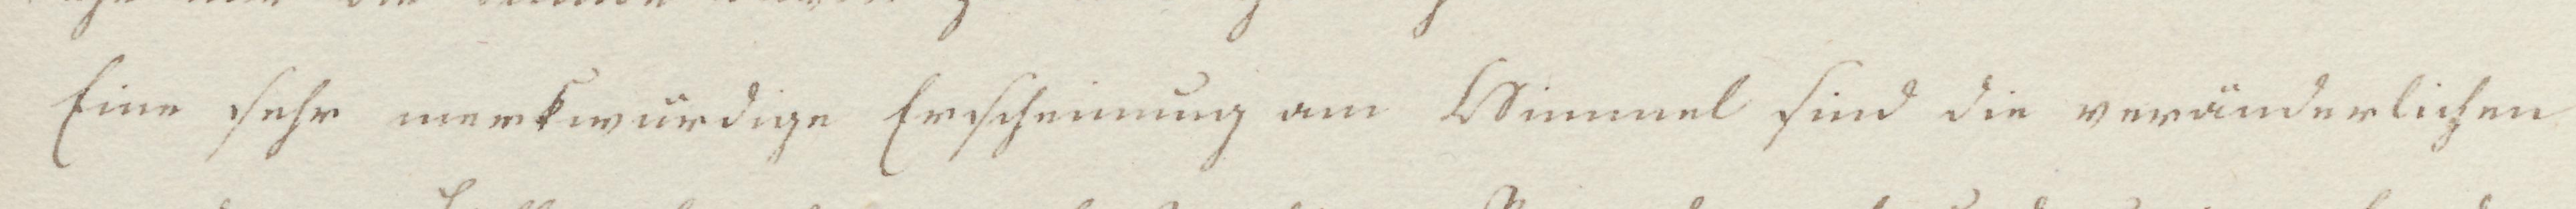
Eine sehr merkwürdige Erscheinung am Himmel sind die veränderlichen
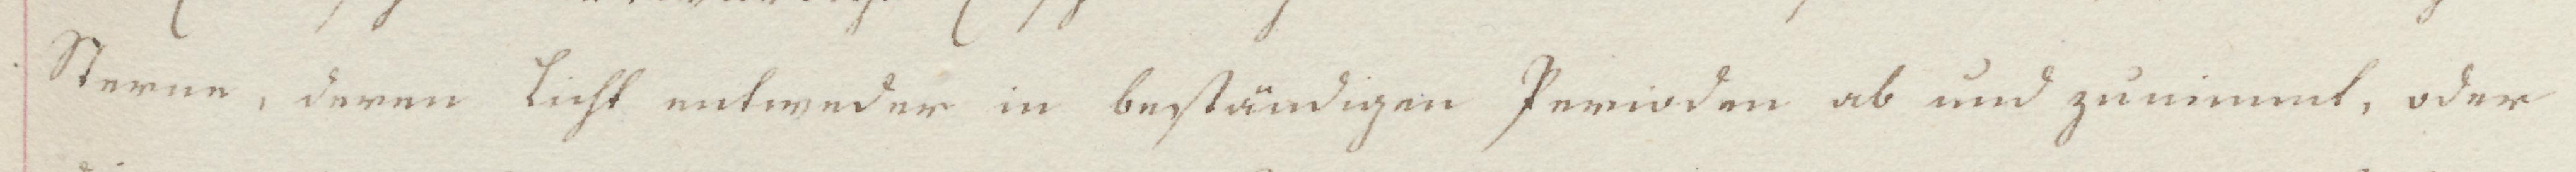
Sterne, deren Licht entweder in beständigen Perioden ab und zunimmt, oder
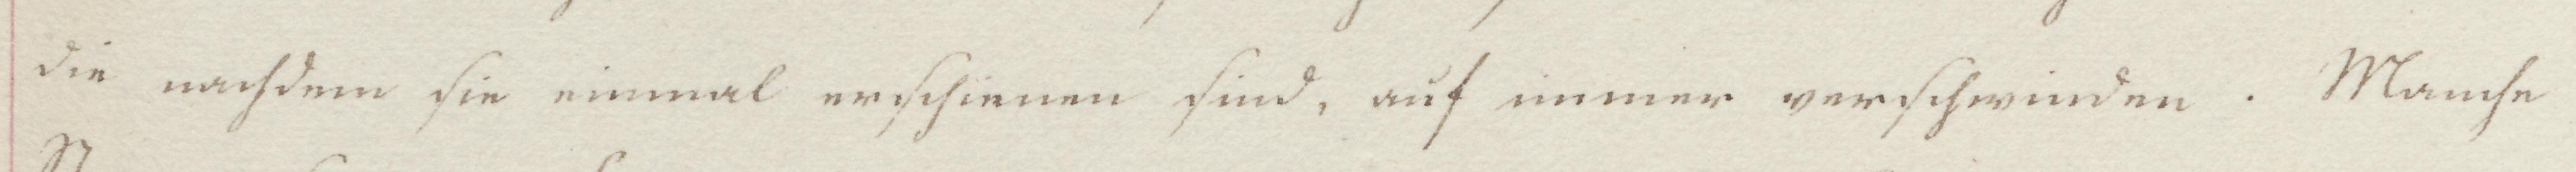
die nachdem sie einmal erschienen sind, auf immer verschwinden. Manche
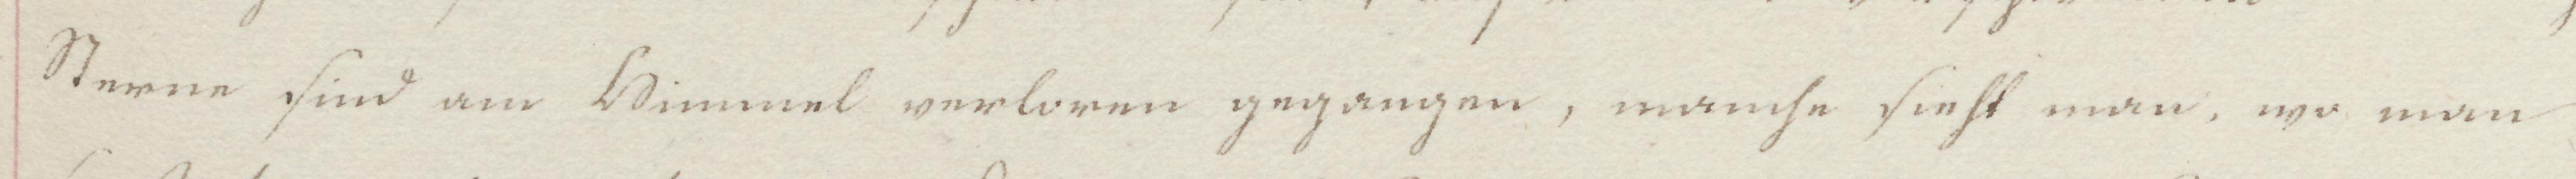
Sterne sind am Himmel verloren gegangen, manche sieht man, wo man
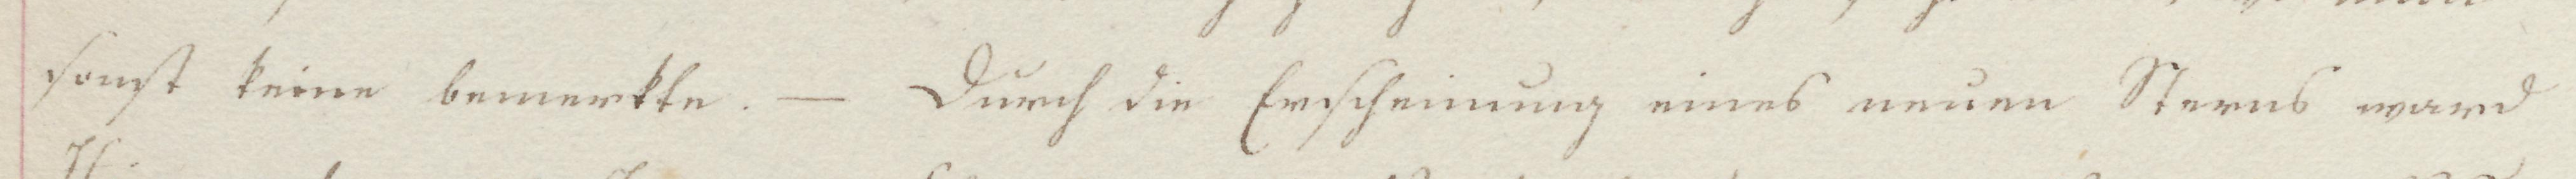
sonst keine bemerkte. – Durch die Erscheinung eines neuen Sterns ward
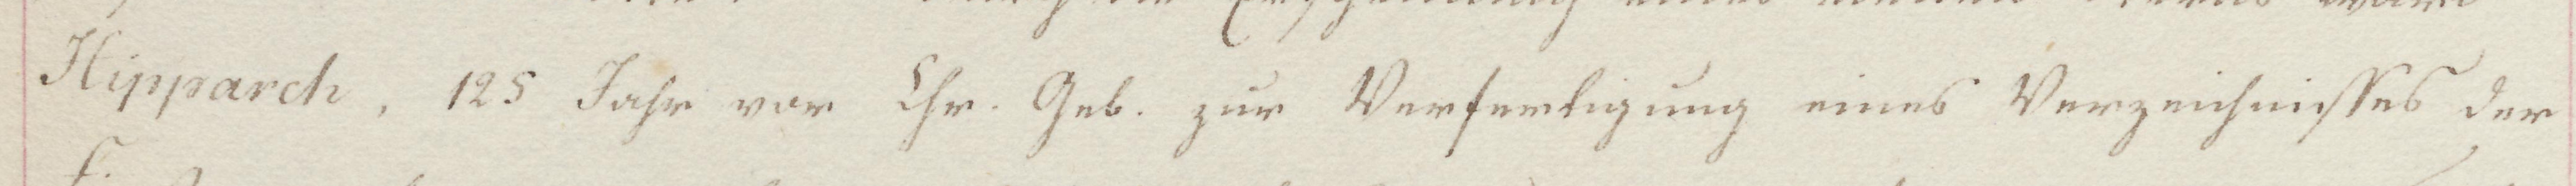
Hipparch, 125 Jahr vor Chr. Geb. zur Verfertigung eines Verzeichnisses der
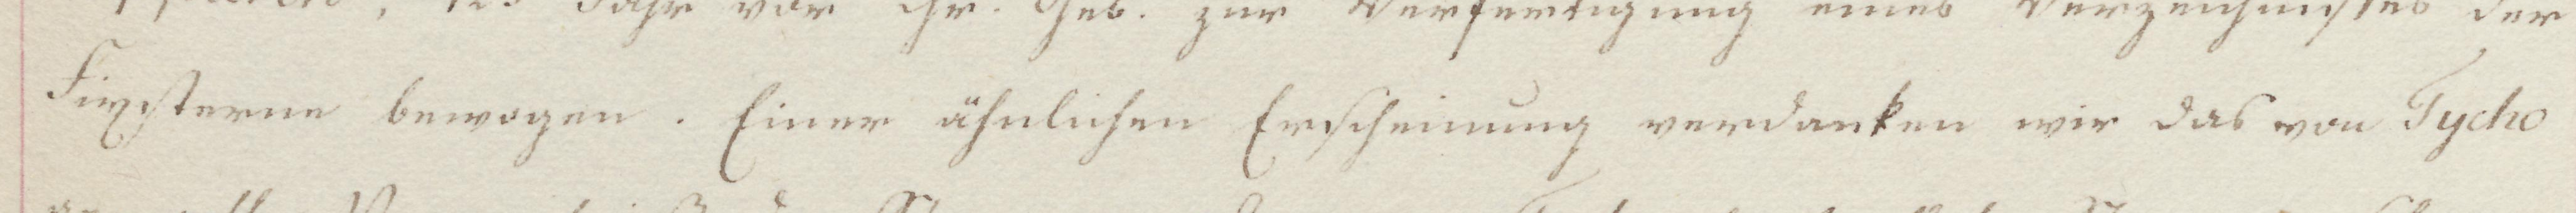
Fixsterne bewogen. Einer ähnlichen Erscheinung verdanken wir das von Tycho
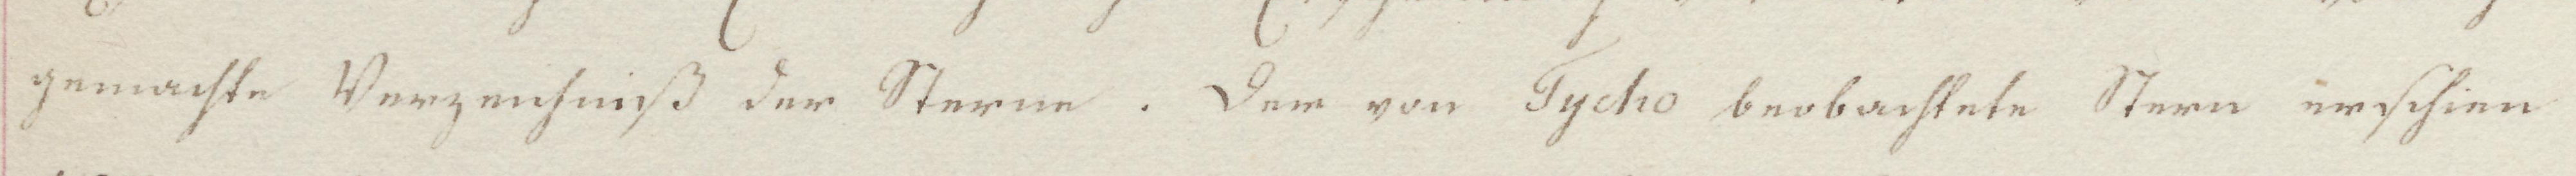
gemachte Verzeichniß der Sterne. Der von Tycho beobachtete Stern erschien
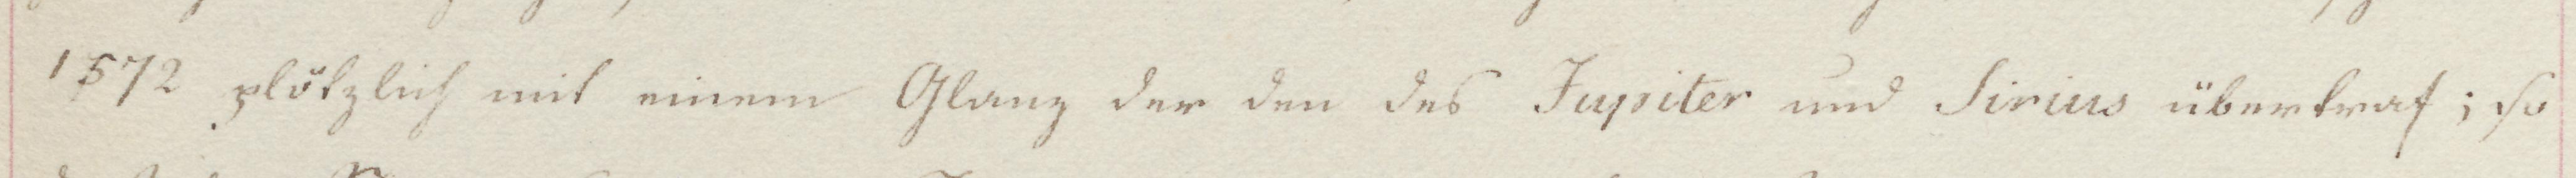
1572 plötzlich mit einem Glanz der den des Jupiter und Sirius übertraf; so
